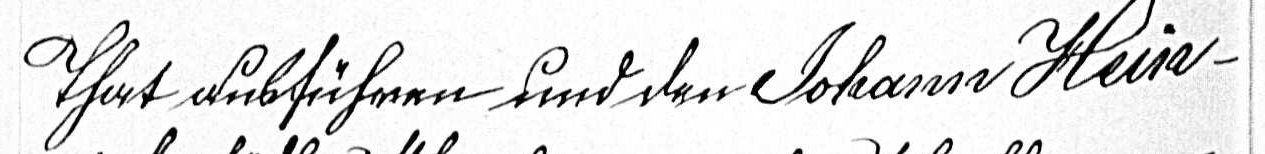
That ausführen und den Johann Hein¬
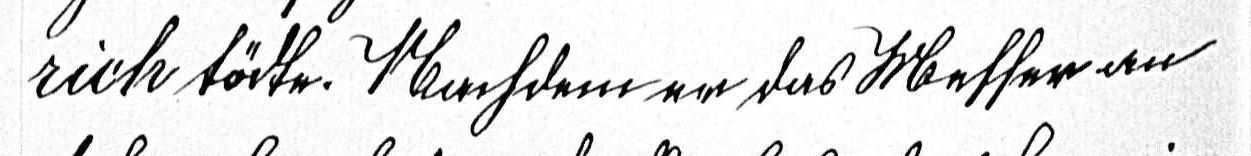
rich tödte. Nachdem er das Messer an
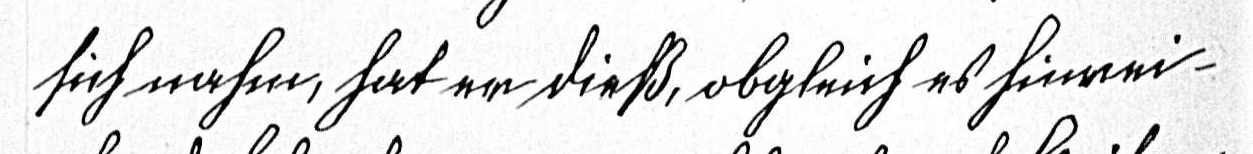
sich nahm, hat er dieß, obgleich es hinrei¬
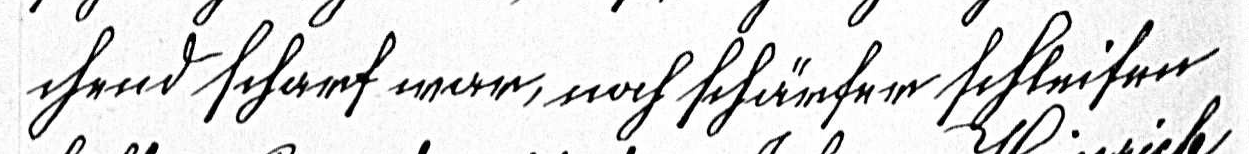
chend scharf war, noch schärfer schleifen
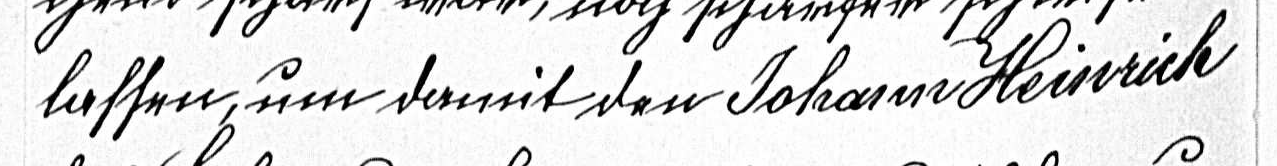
lassen, um damit den Johann Heinrich
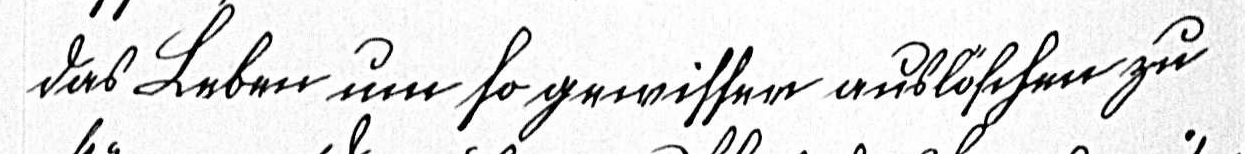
das Leben um so gewisser auslöschen zu
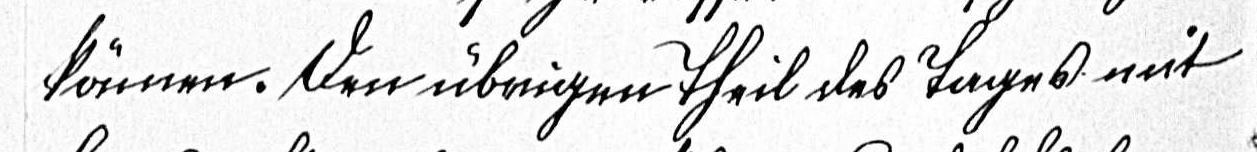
können. Den übrigen Theil des Tages mit
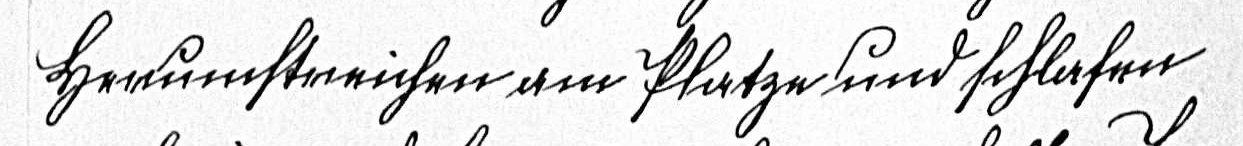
Herumstreichen am Platze und schlafen
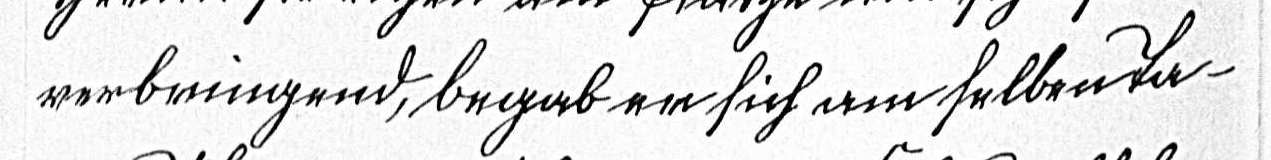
verbringend, begab er sich am selben Ta¬
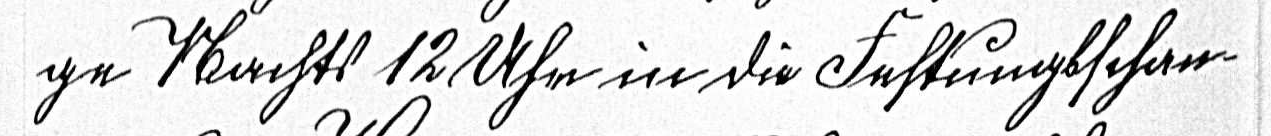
ge Nachts 12 Uhr in die Festungsschan¬
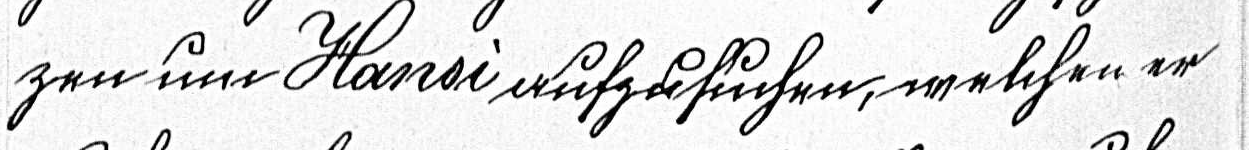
zen um Hansi aufzusuchen, welchen er
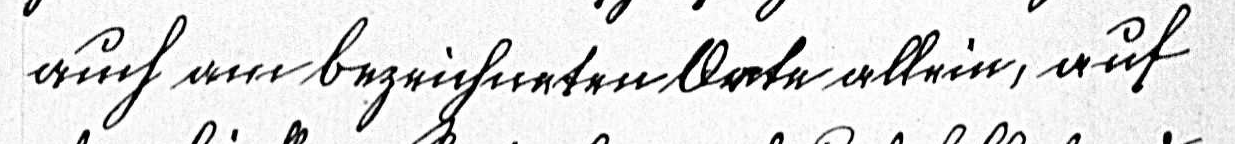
auch am bezeichneten Orte allein, auf
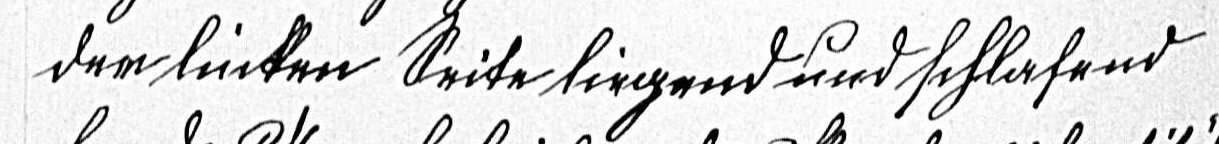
der linken Seite liegend und schlafend
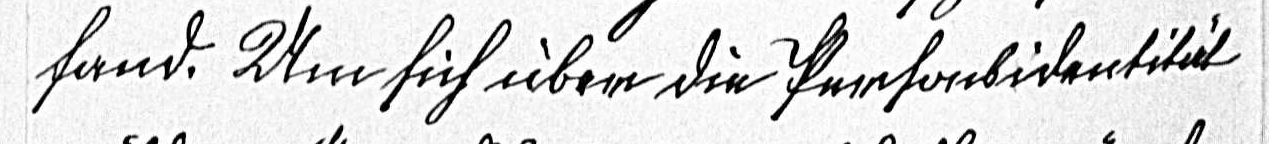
fand. Um sich über die Personsidentität
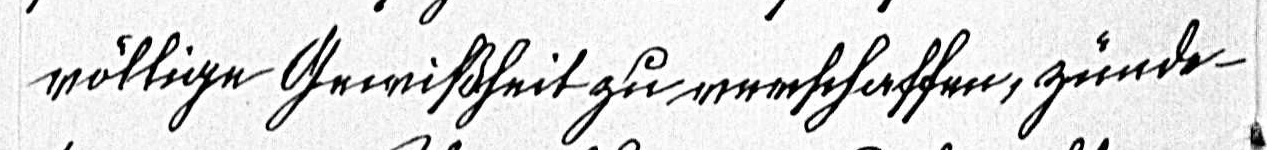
völlige Gewißheit zu verschaffen, zünde¬
